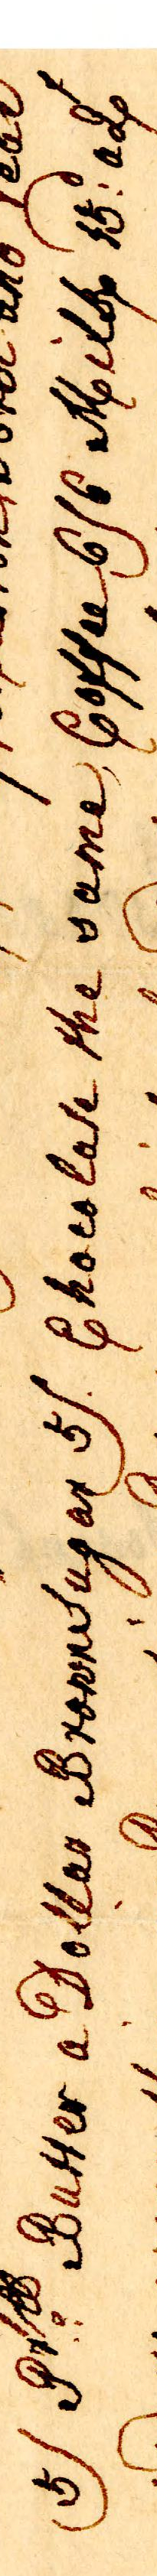5s per lb Butter a Dollar Brown Sugar 5s. Chocolate the same Coffee 6s6 Milk 15^d. Q^t
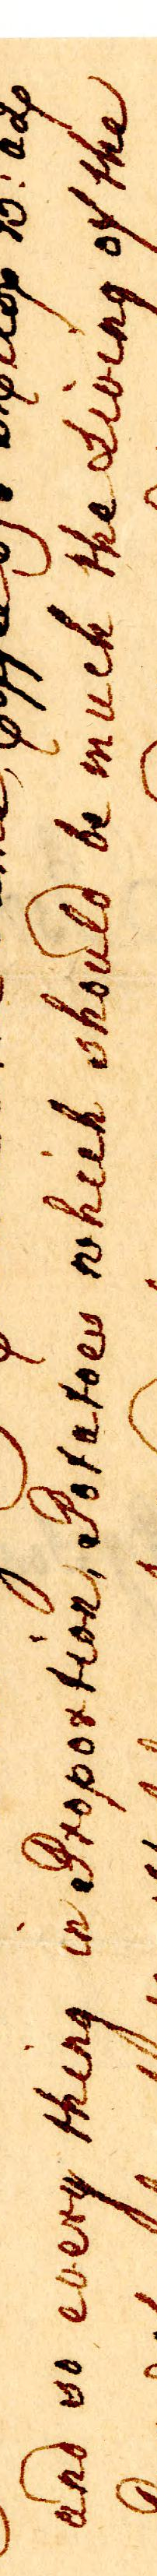and so every thing in Proportion, Potatoes which should be much the Living of the
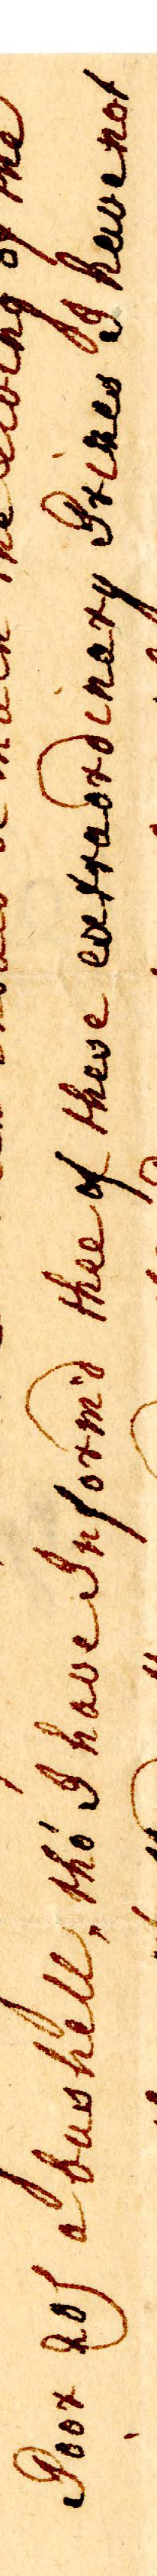Poor 20s a bushell, tho' I have Inform'd thee of these extraordinary Prices I have not
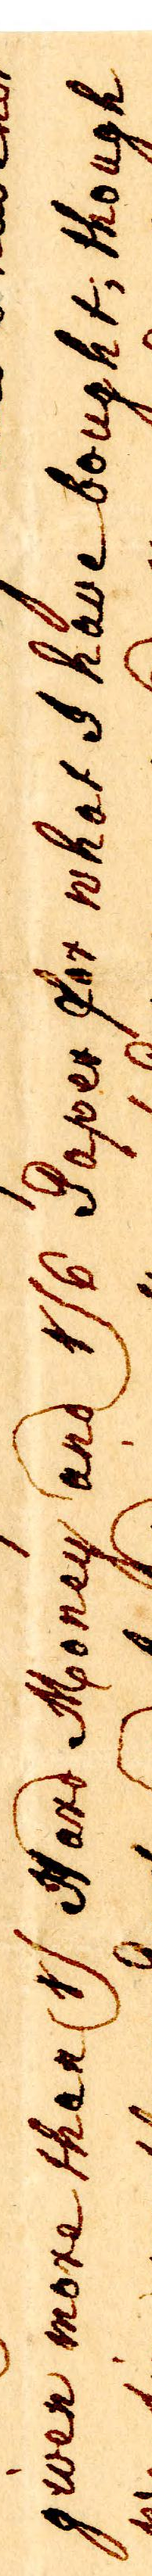given more than 1s Hard Money and 1s6 Paper for what I have bought, though
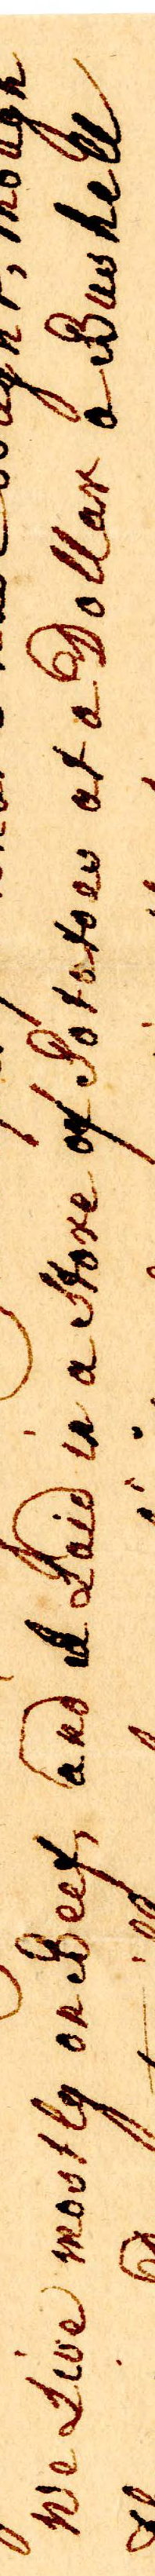we Live mostly on Beef, and I Laid in a Store of Potatoes at a Dollar a Bushell
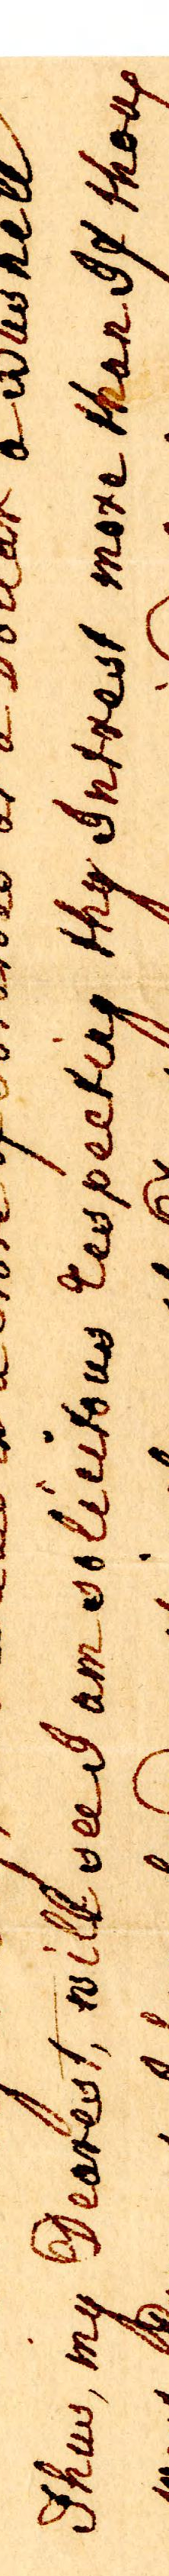Thus, my Dearest, will see I am solicitous respecting thy Intrest more than If thou
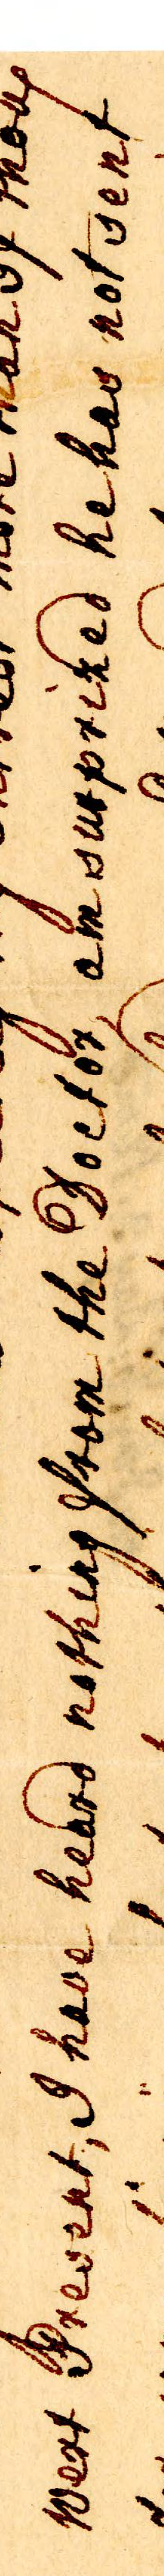wert Present, I have heard nothing from the Doctor, am surprized he has not sent
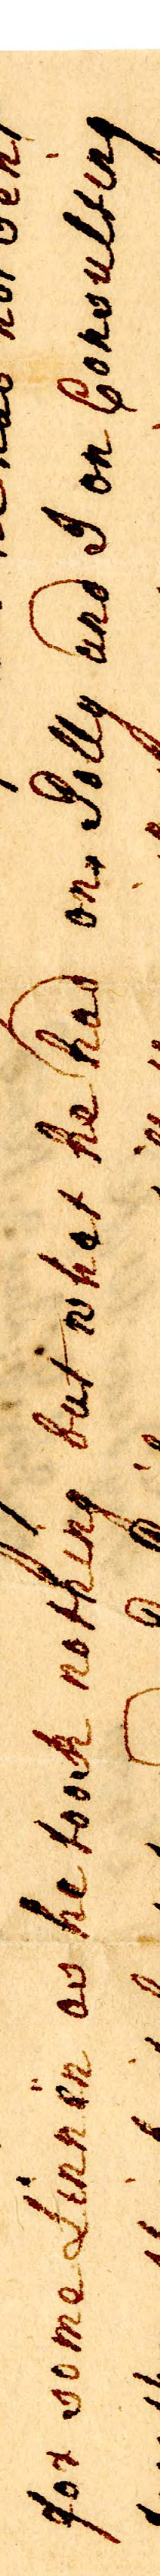for some Linnen as he took nothing but what he had on Polly and I on Consulting
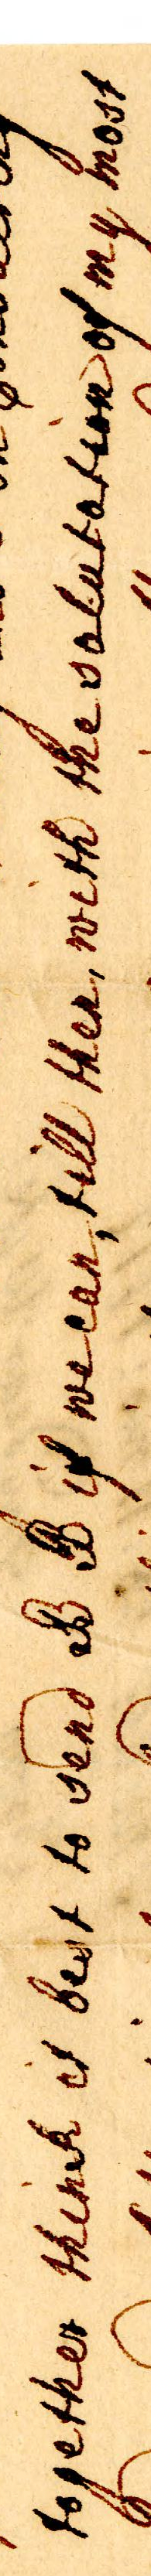together think it best to send B B if we can, till then, with the salutation of my most
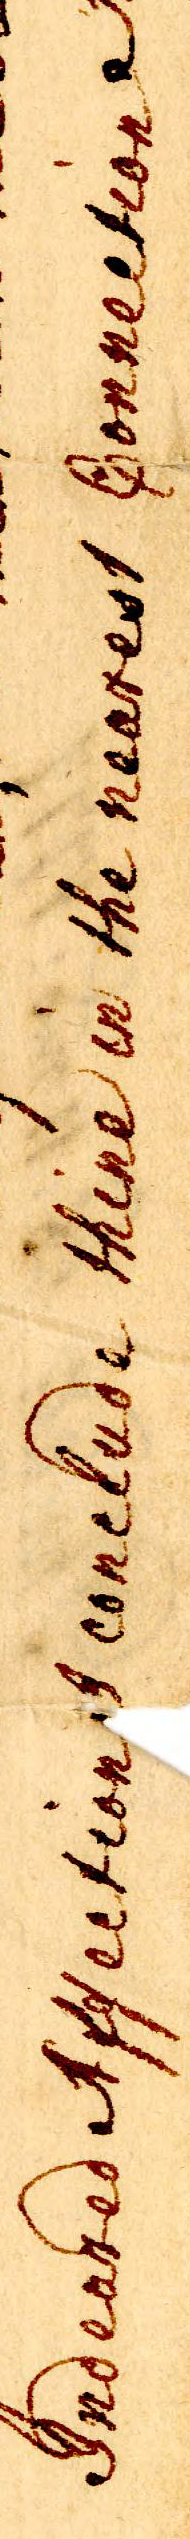Indeared Affection I conclude thine in the nearest connection
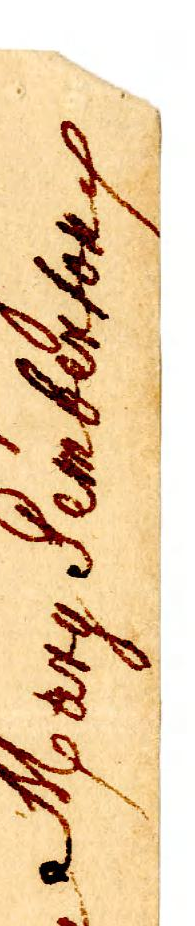Mary Pemberton
